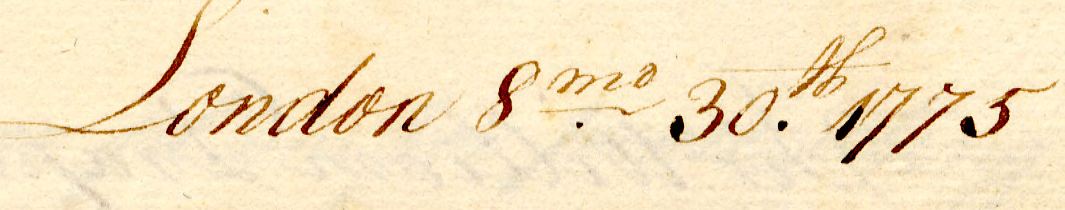London 8^mo. 30^th. 1775
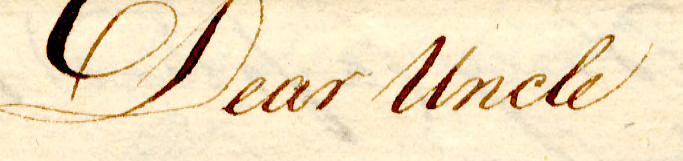Dear Uncle
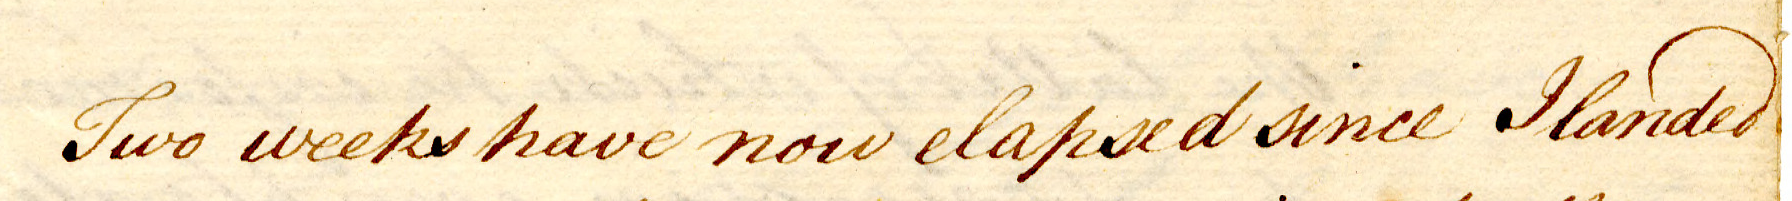Two weeks have now elapsed since I landed
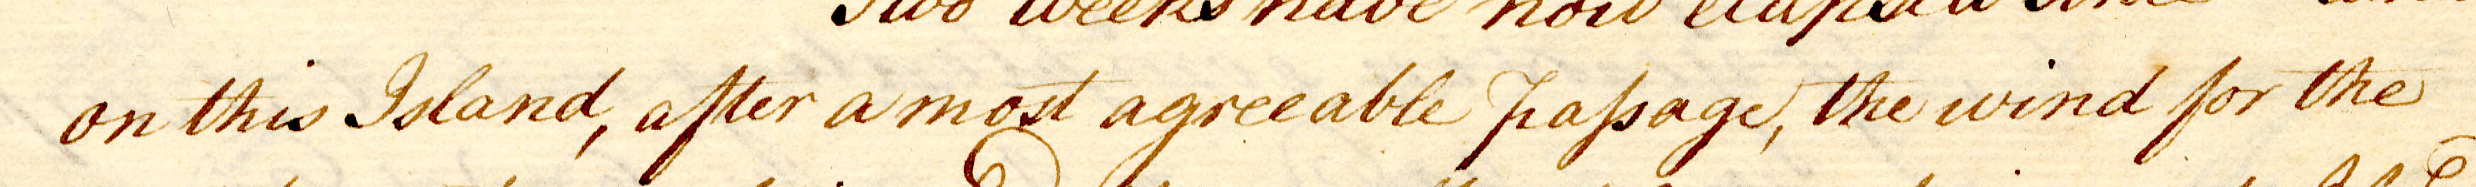on this Island, after a most agreeable passage, the wind for the
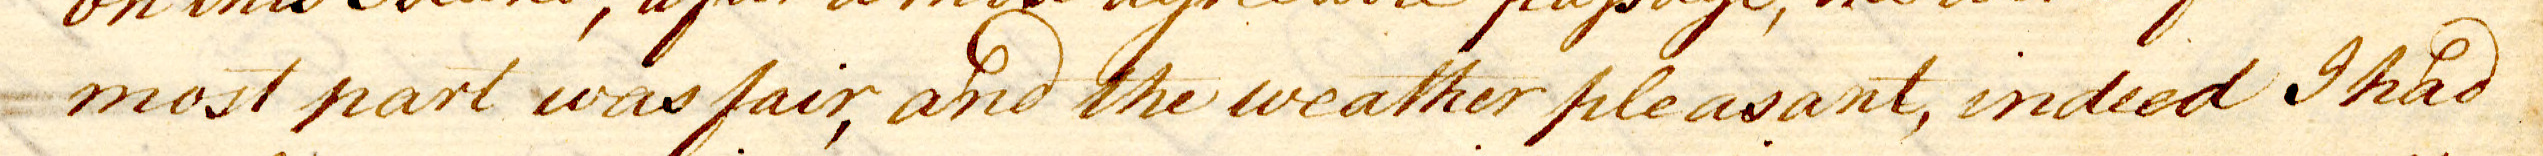most part was fair, and the weather pleasant, indeed I had
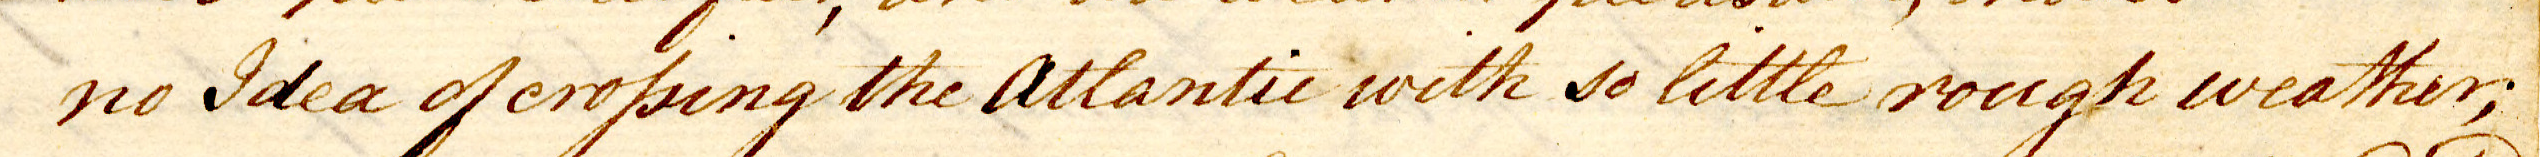no Idea of crossing the Atlantic with so little rough weather,
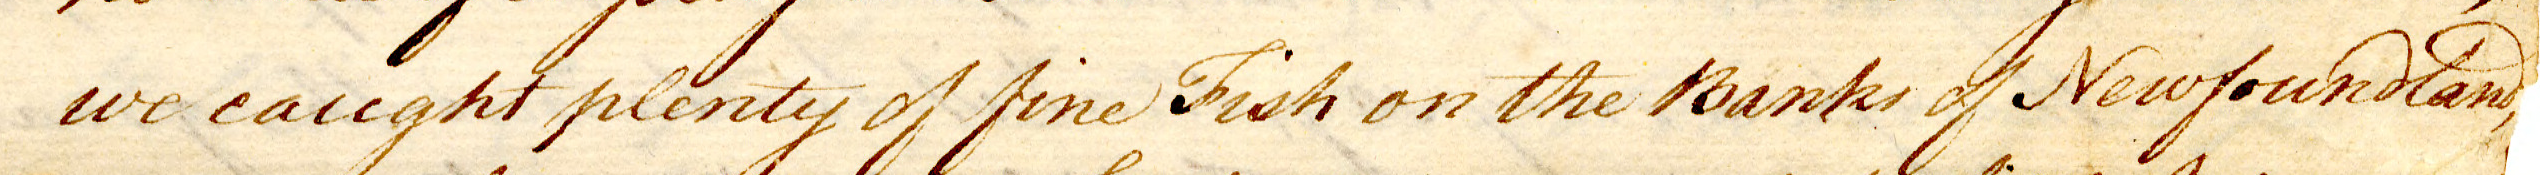we caught plenty of fine Fish on the Banks of Newfoundland,
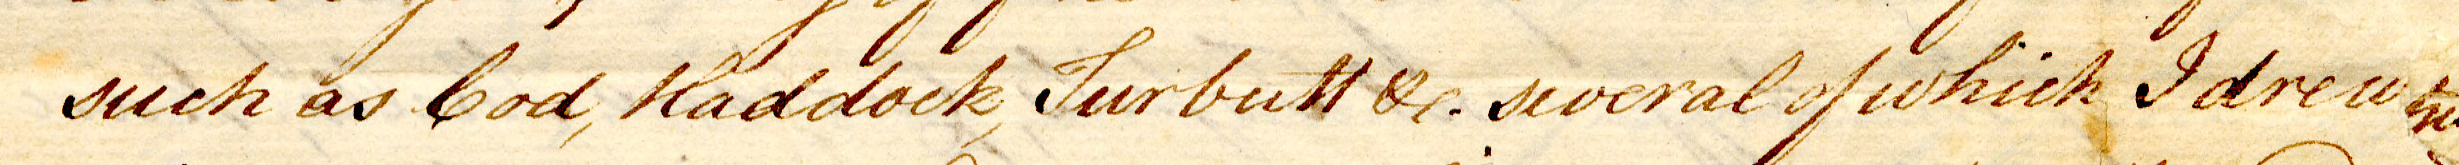such as Cod, Haddock, Turbutt &c. several of which I drew
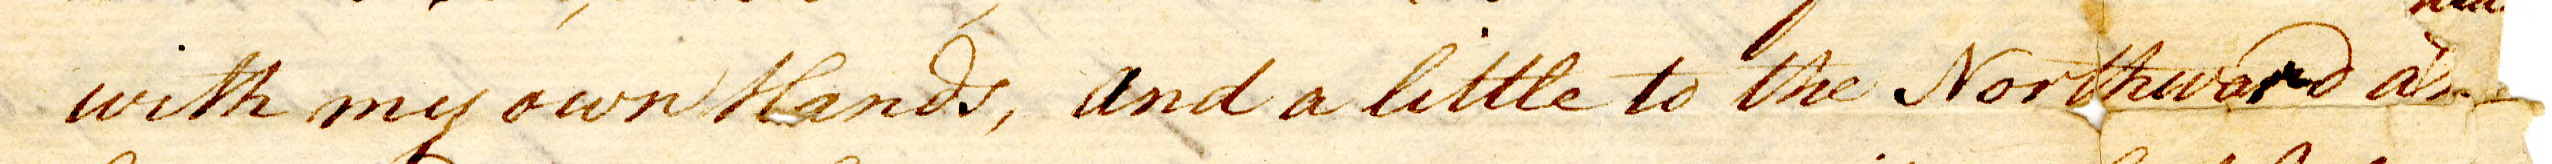with my own Hands, and a little to the Northward a
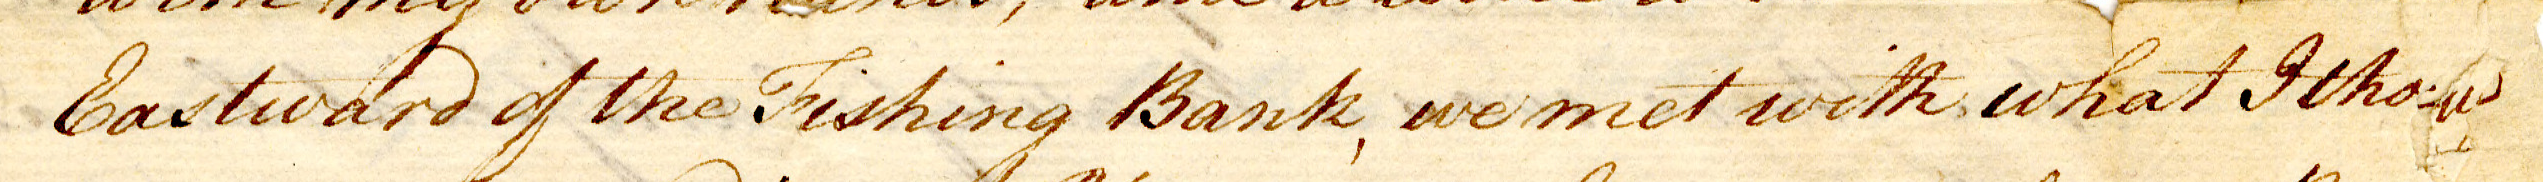Eastward of the Fishing Bank, we met with what I thou[_]
